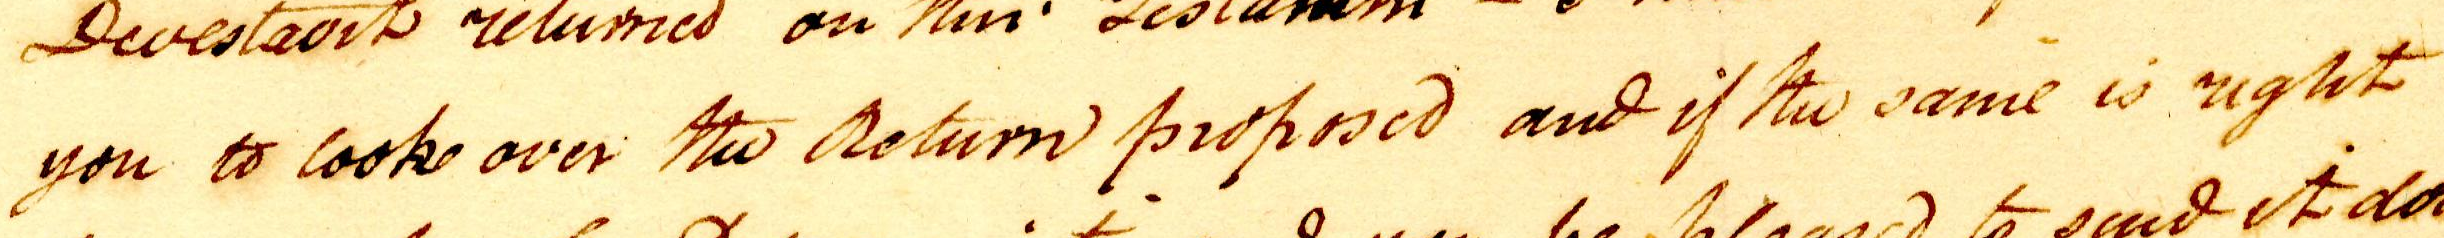you to look over the Return proposed and if the same is right
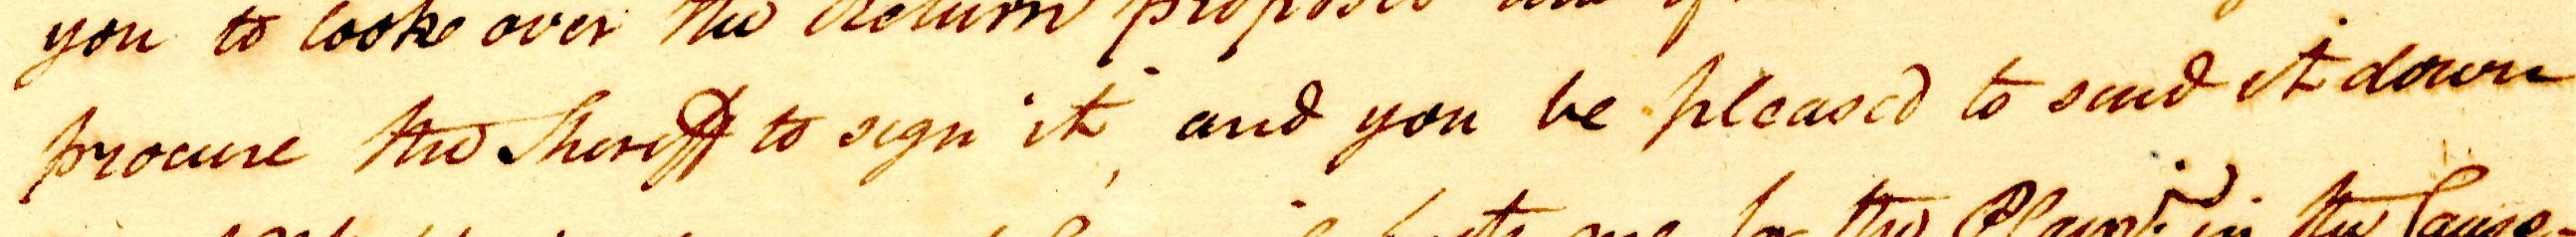procure the Sheriff to sign it and you be pleased to send it down
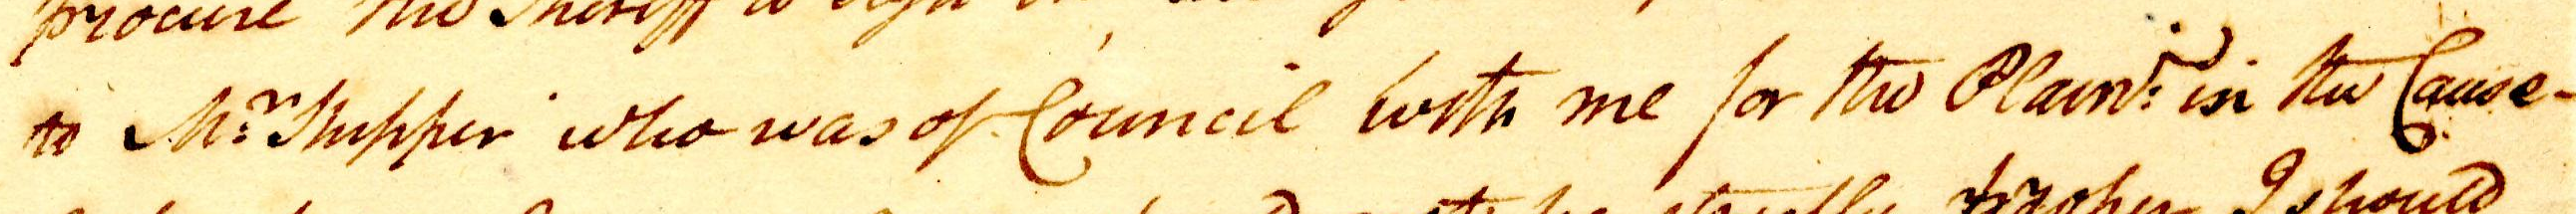to M^r Shippen who was of Council with me for the Plan^f in the Cause
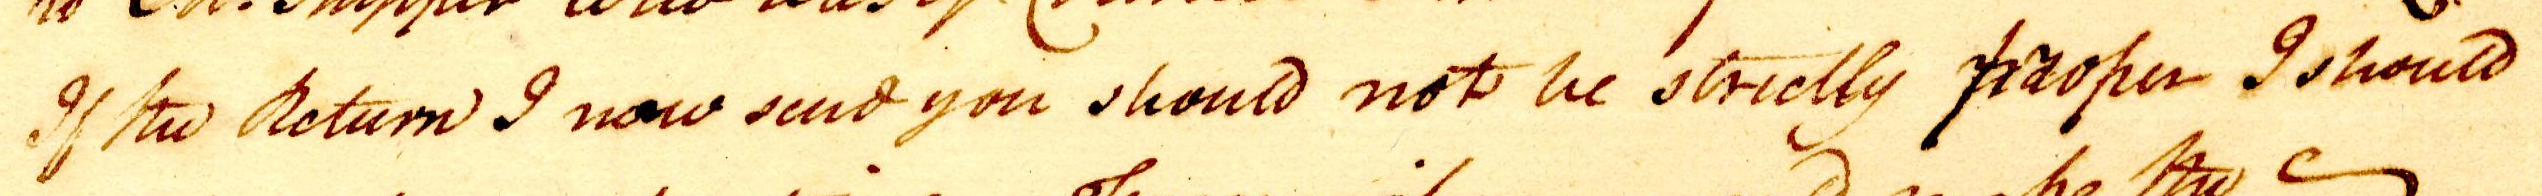If the Return I now send you should not be strictly proper I should
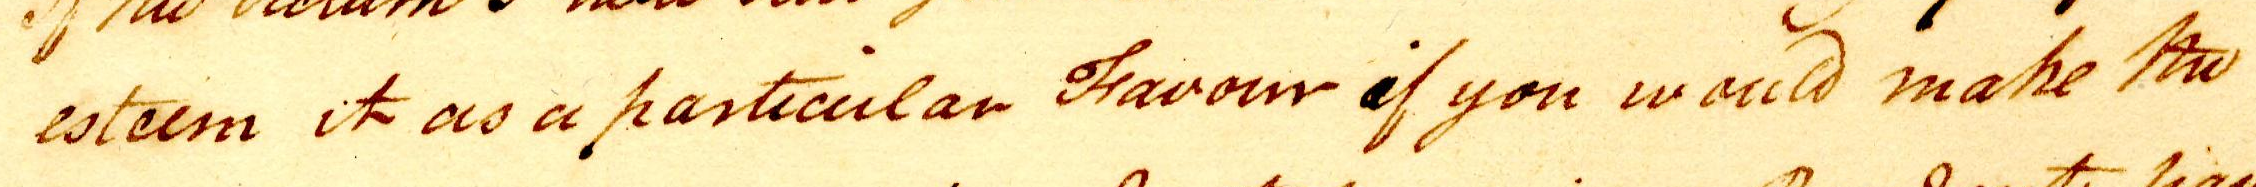esteem it as a particular Favour if you would make the
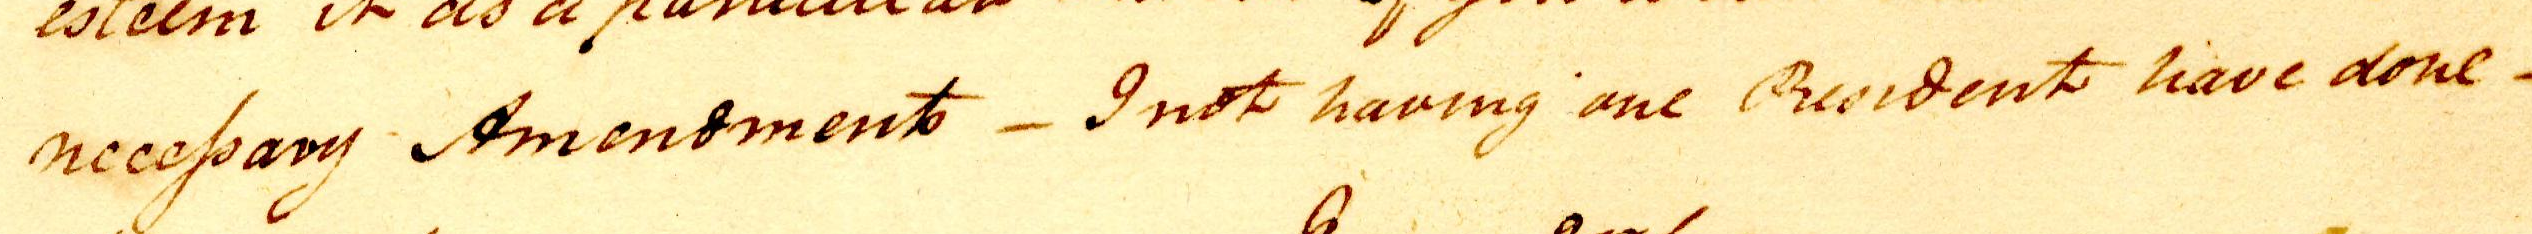necessary Ammendment. I not having one Resident have done.
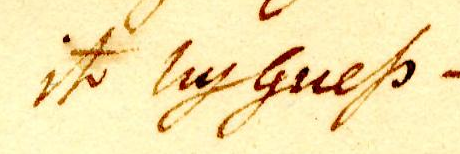it by guess
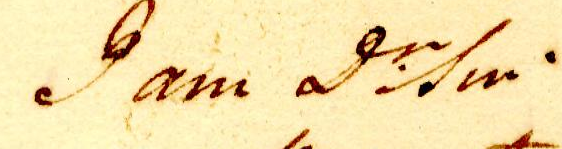I am D^r Sir
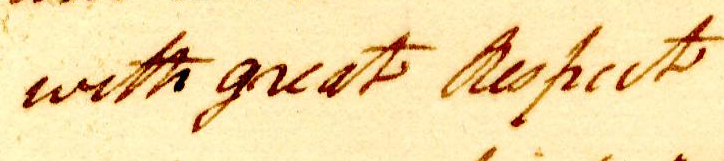with great Respect
